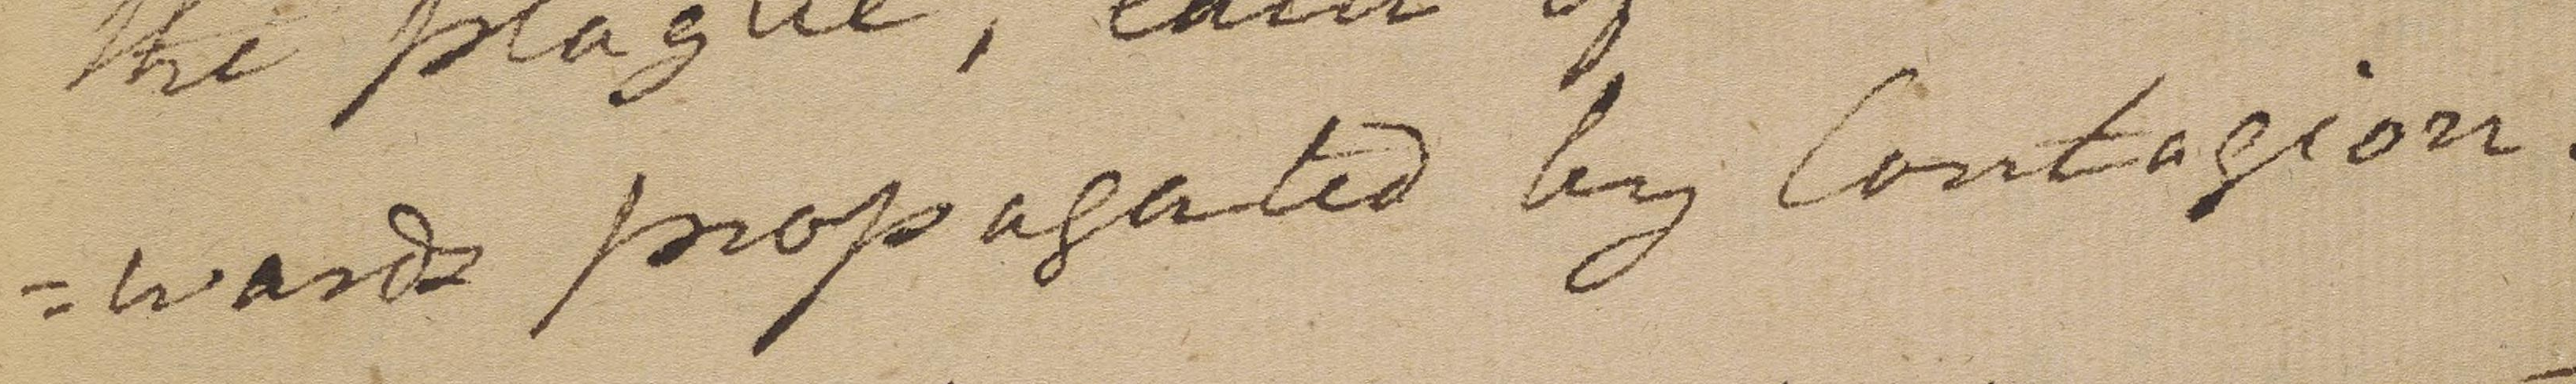-wards propagated by Contagion.
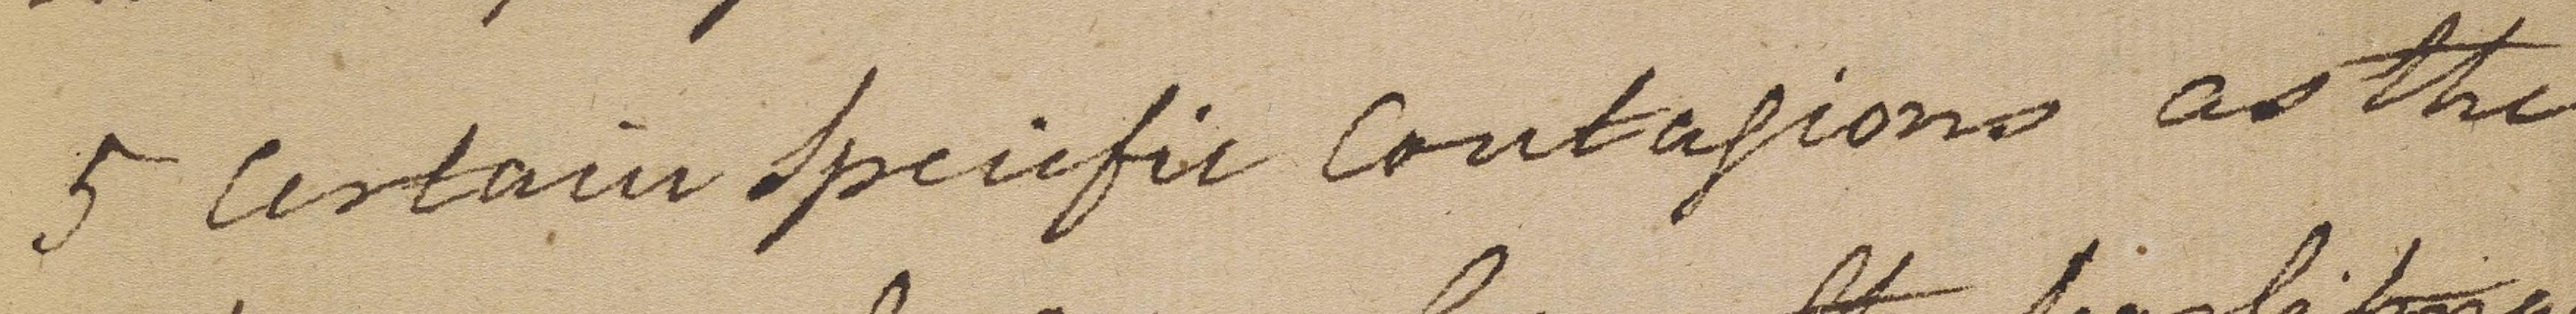5 Certain specific contagions as the
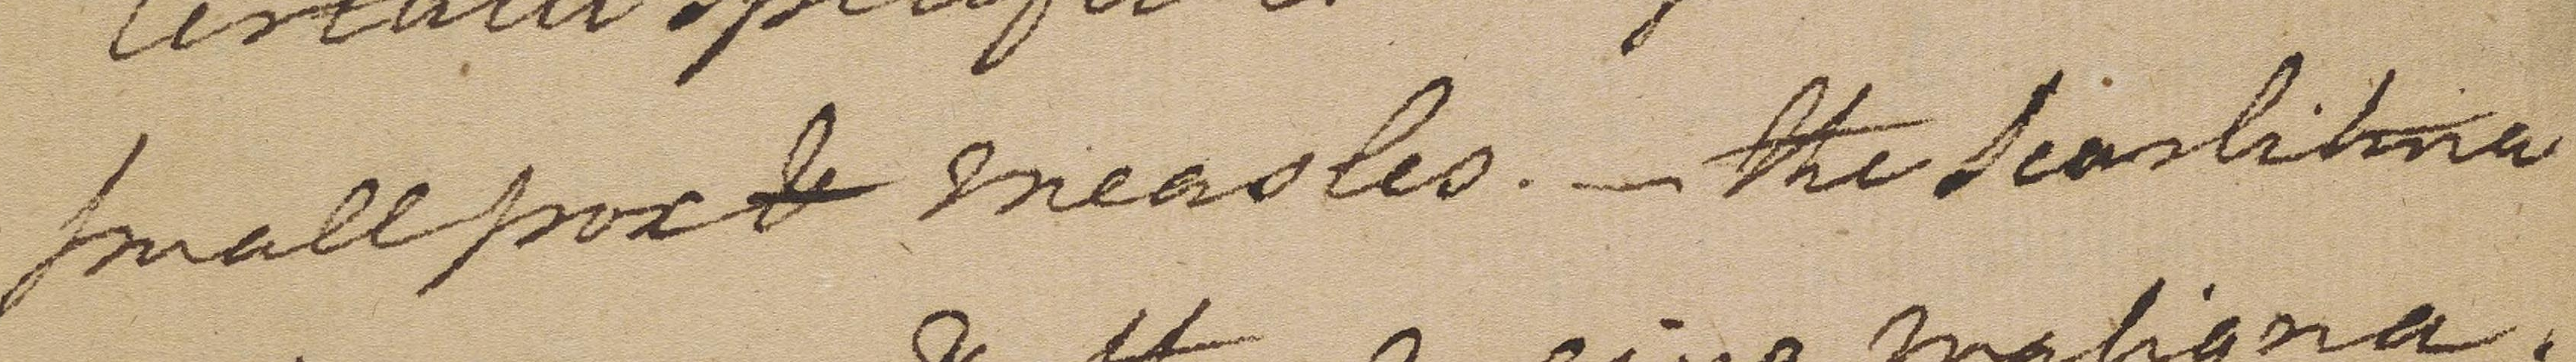smallpox & measles. the scarlitina
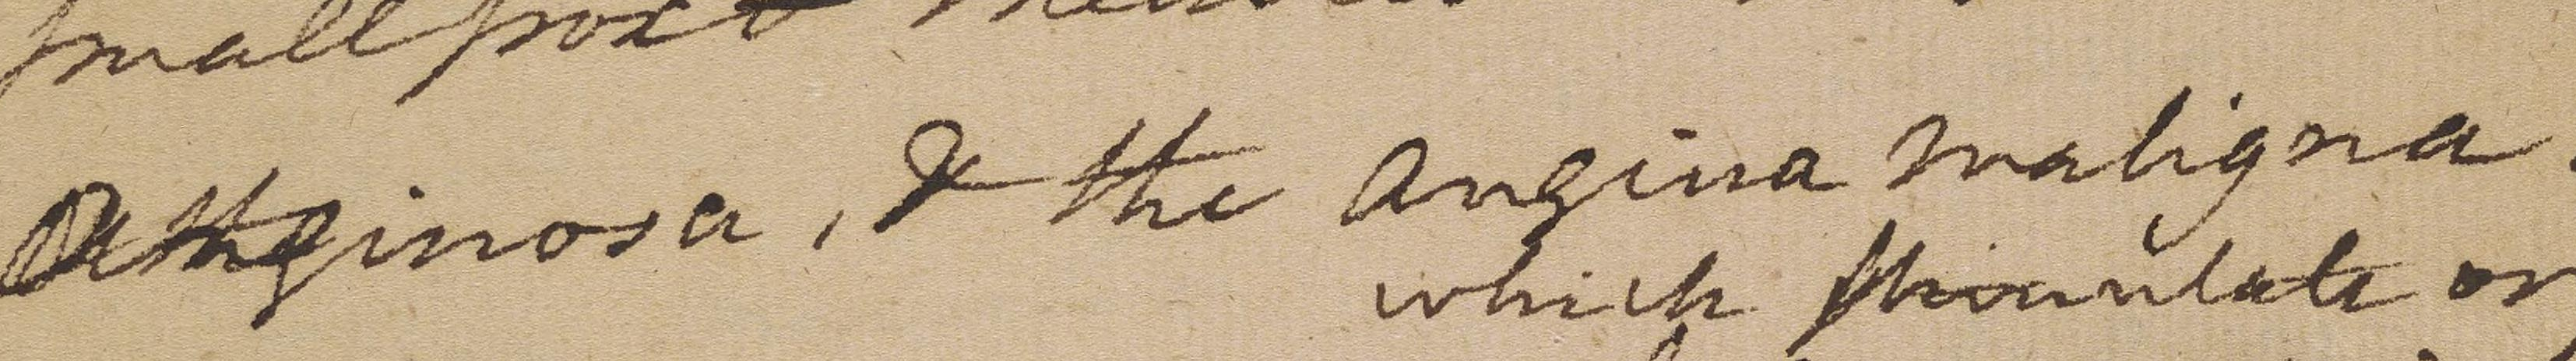Anginosa, & the angina maligna.
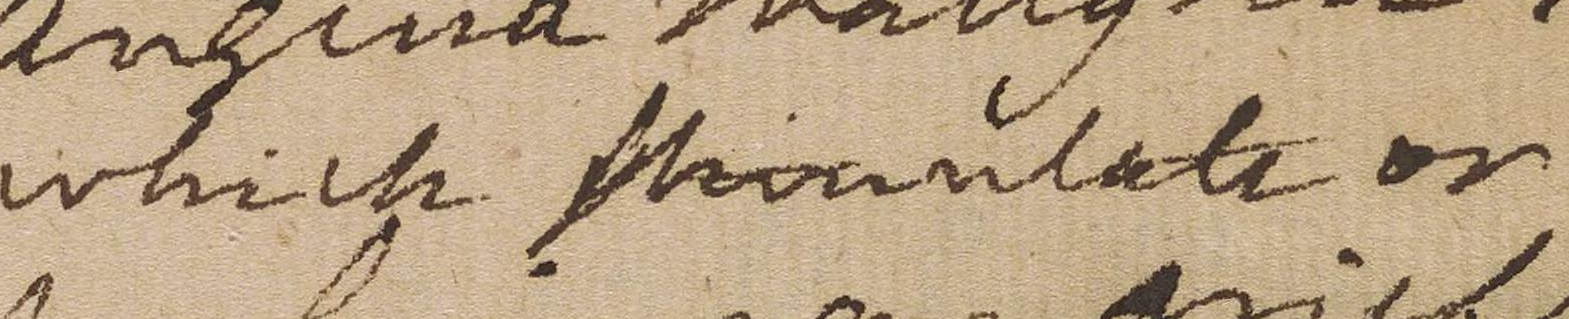which stimulate or
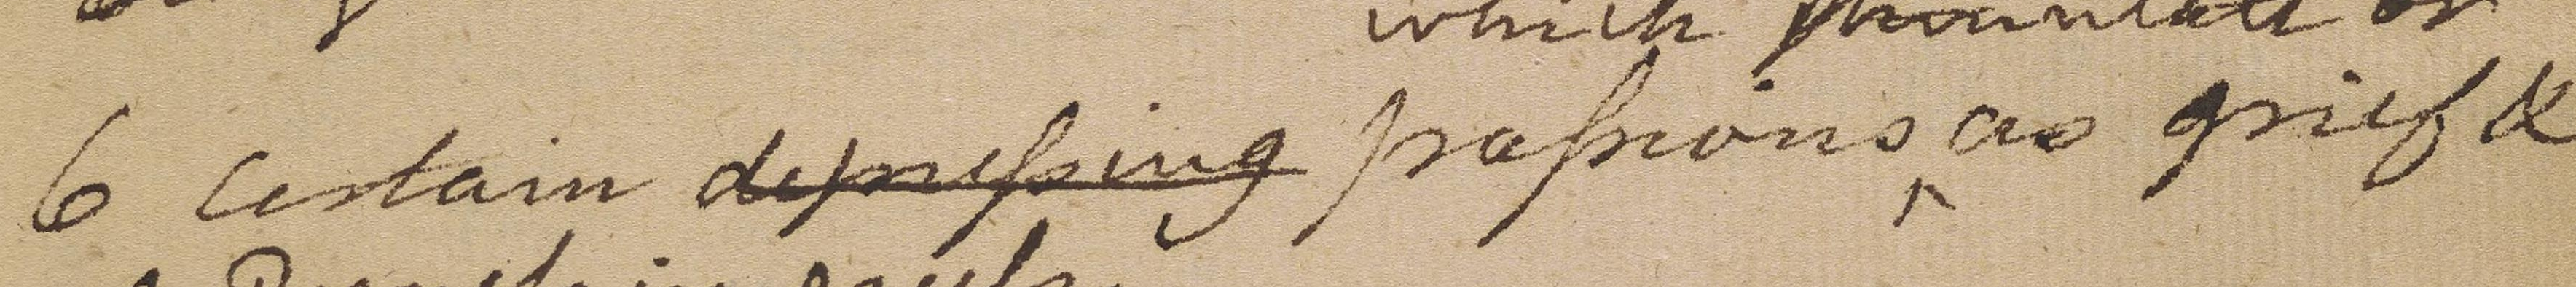6 Certain [depressing] passions ^ as grief &
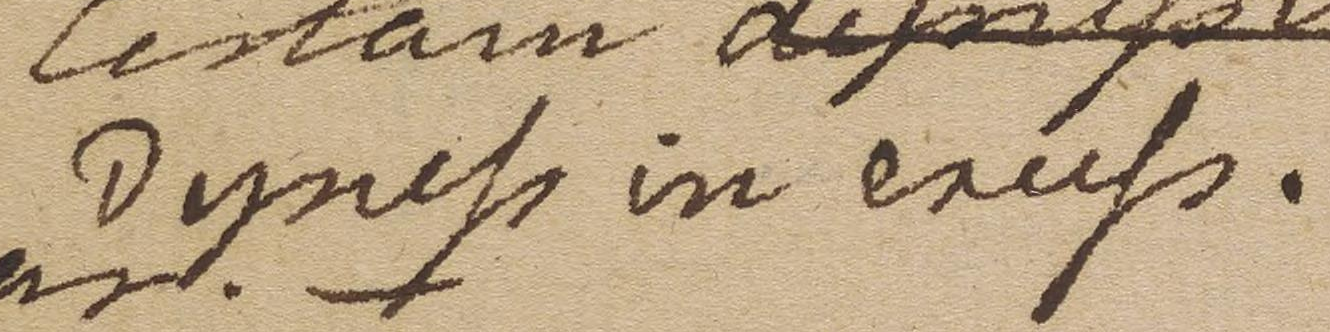Dryness in excess.
